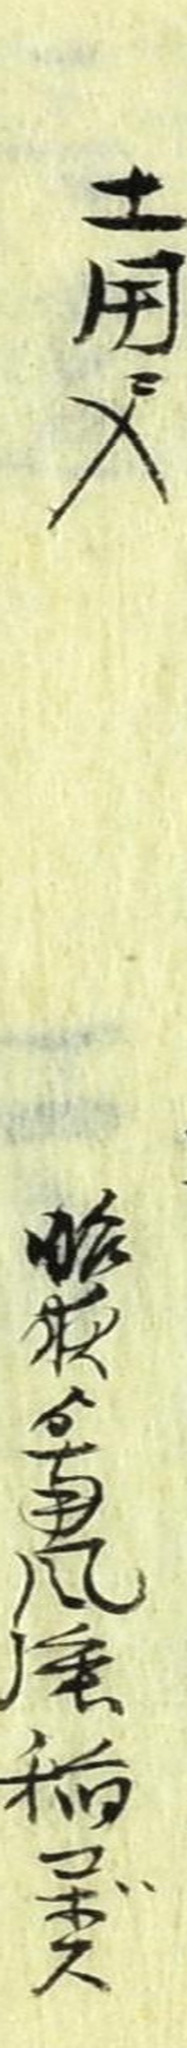土用に入昨夜ゟ南風強稲こぼす
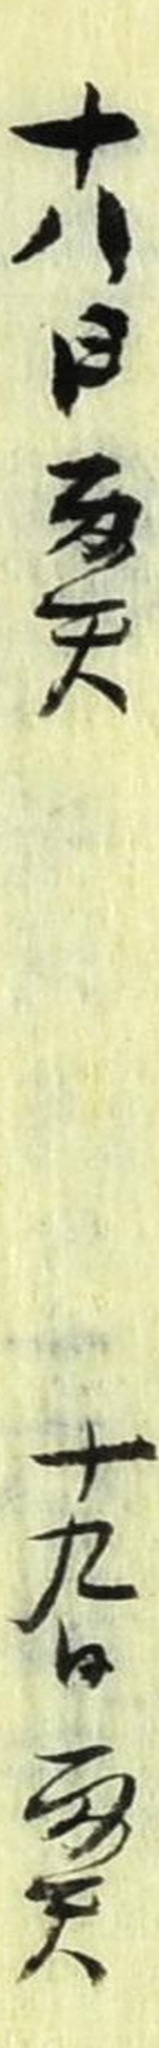十八日雨天十九日雨天
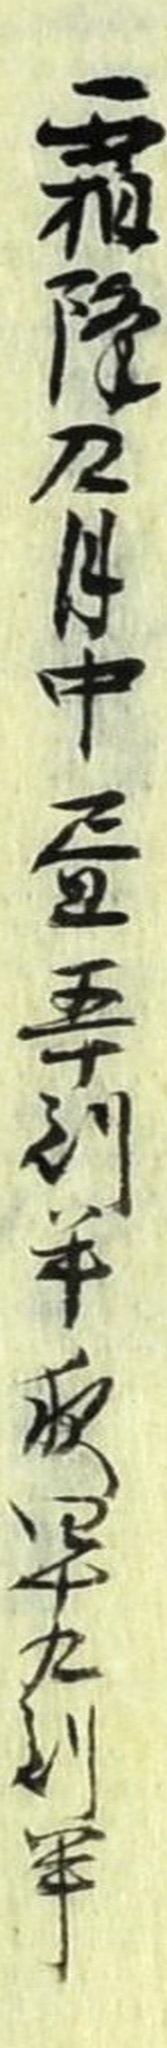霜降九月中昼五十刻半夜四十九刻半
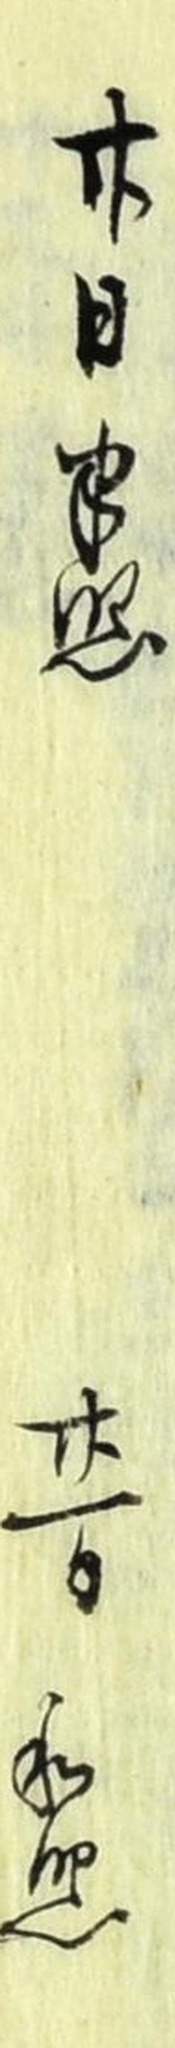廿日半照廿一日和照
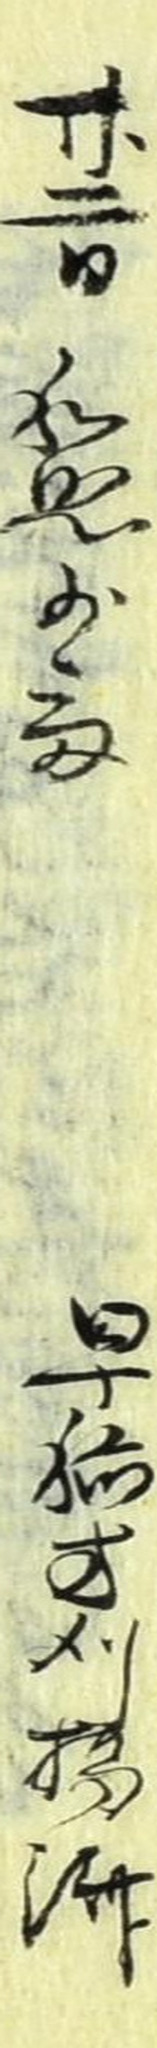廿二日和照少々雨早稲方刈揚済
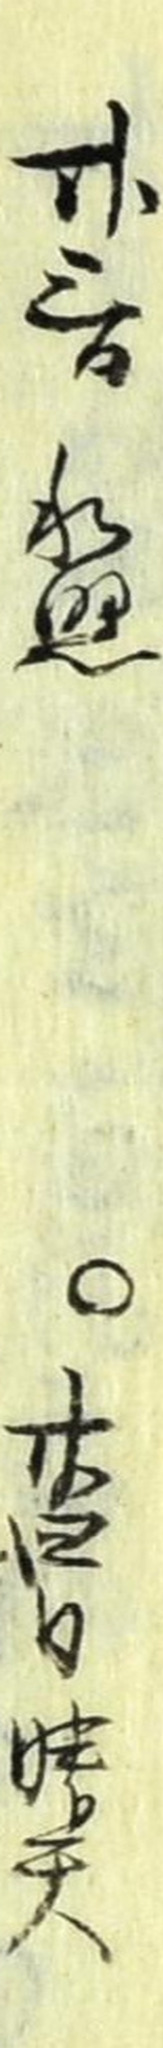廿三日和照○廿四日晴天
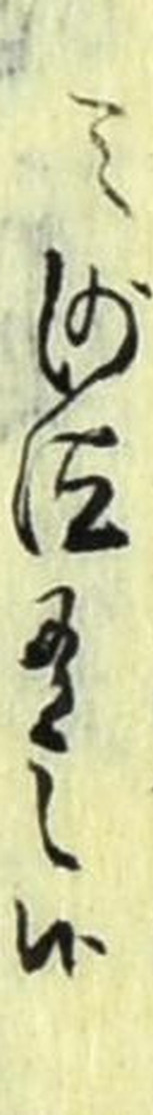之沙汰有之候

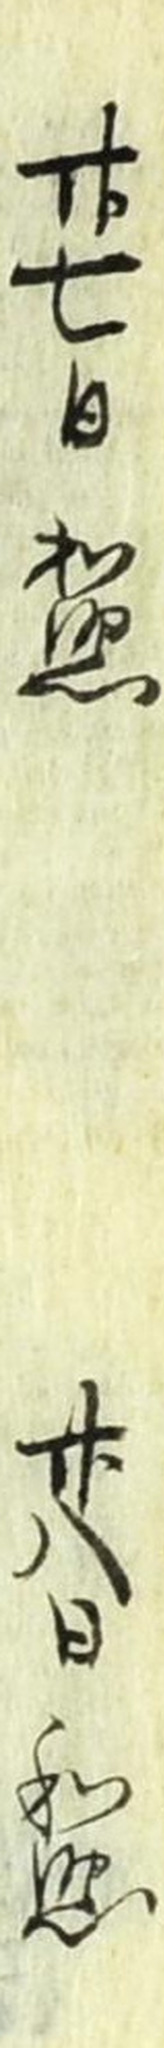廿七日和照廿八日和照
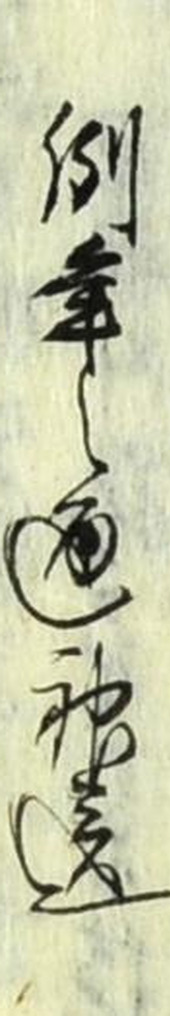例年之通神送
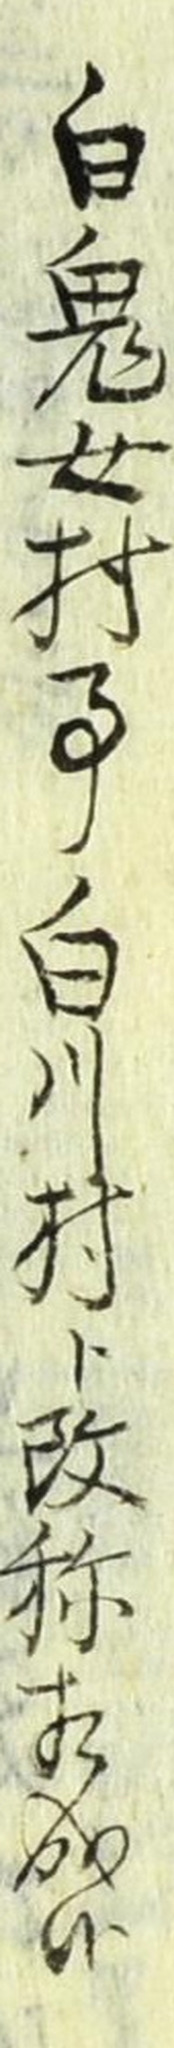白鬼女村事白川村と改称相成候

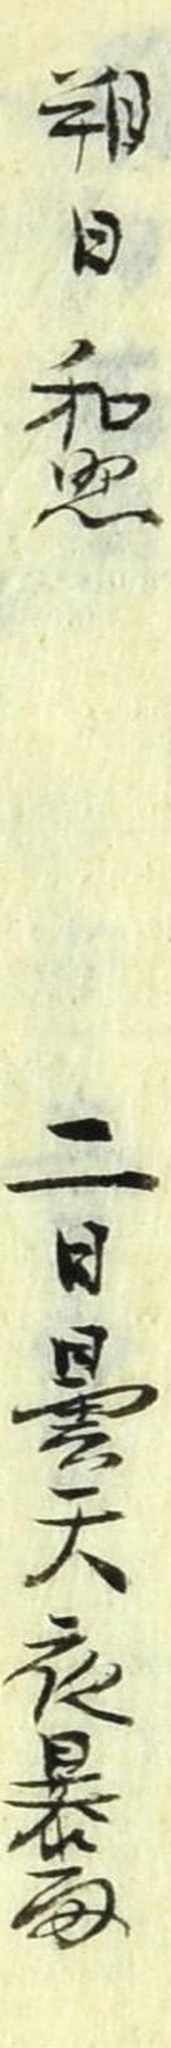朔日和照二日曇天夜暴雨
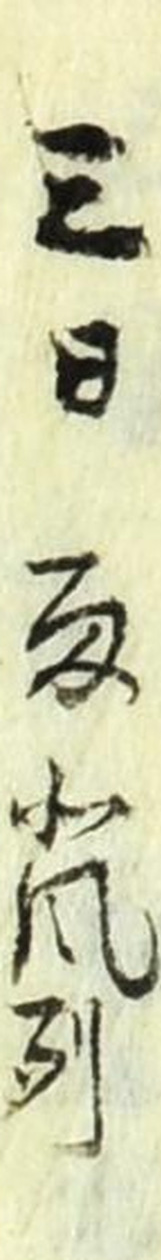三日雨北風列
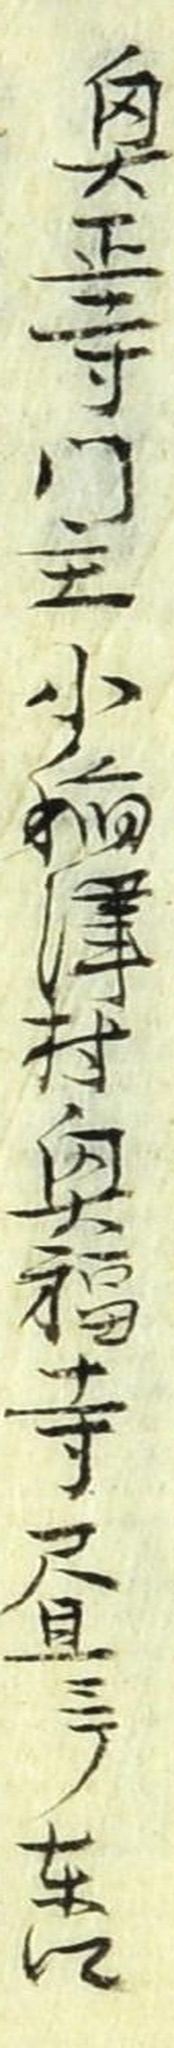興正寺門主小稲津村興福寺昼まて東郷
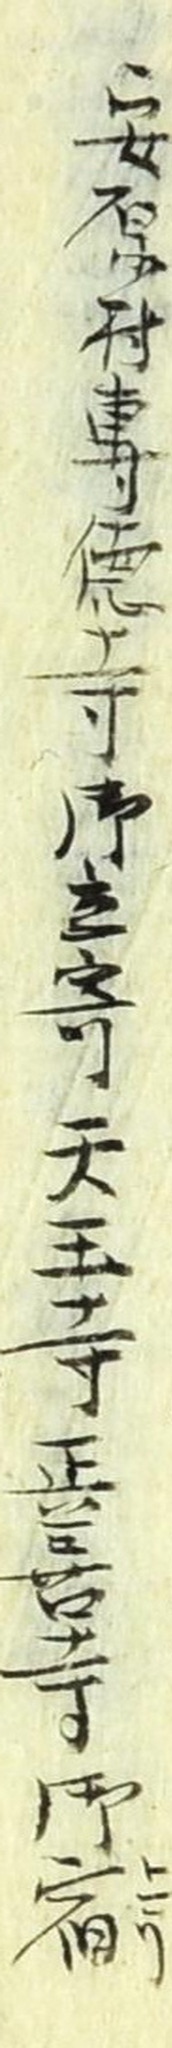安原村専徳寺御立寄天王寺正善寺御宿
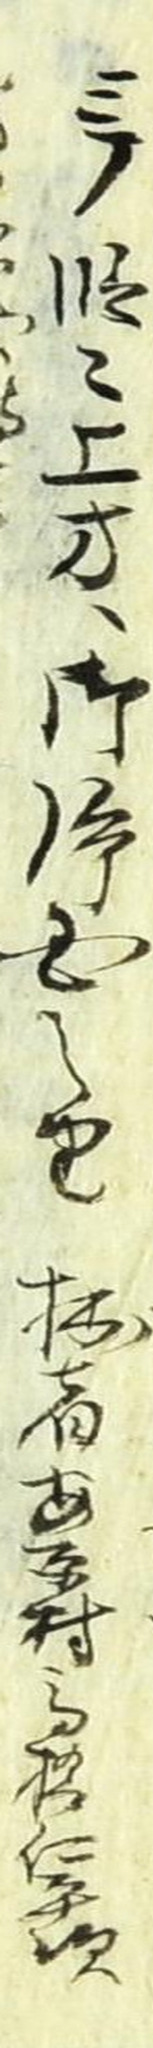にて段々上方へ御帰国之由拙者安原村高橋仁平次
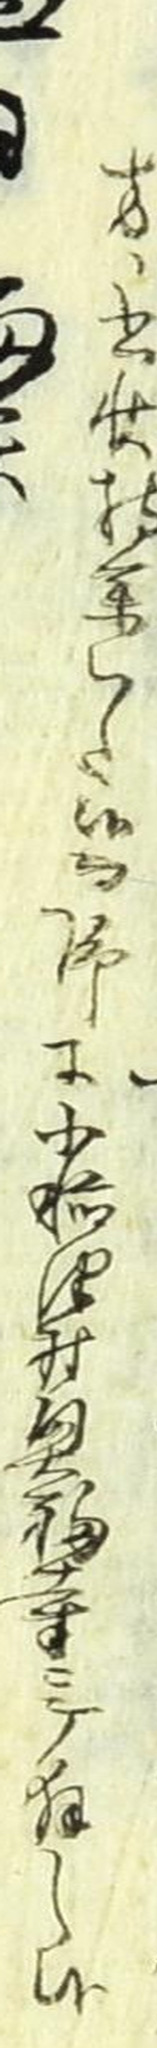方へ書状持参いた候而帰に小稲津村興福寺にて拝し候
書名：（日記）
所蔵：福井県文書館 Fukui Prefectural Archives
